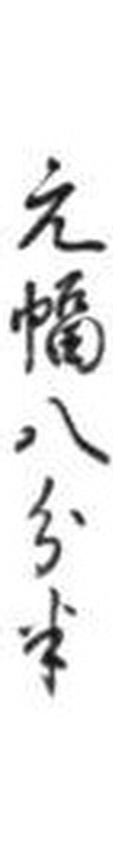元幅八分半
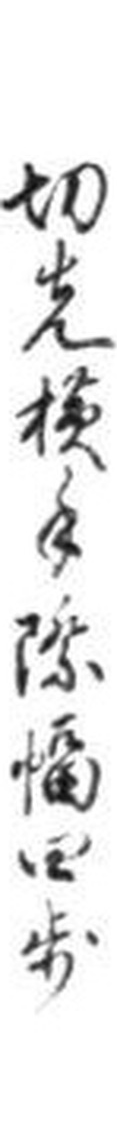切先横手際幅四歩
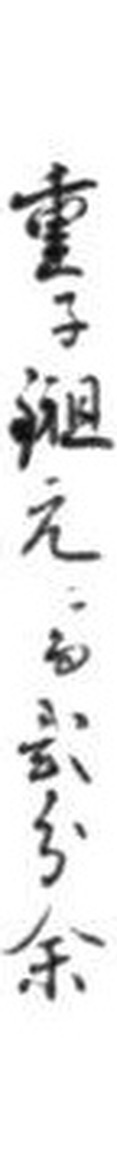重子鎺元ニ而弐分余
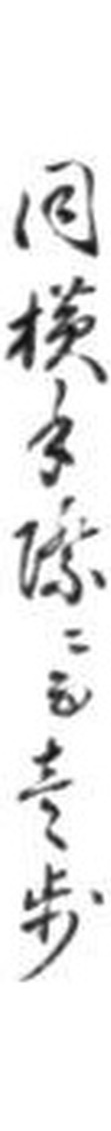同横手際ニ而壱歩
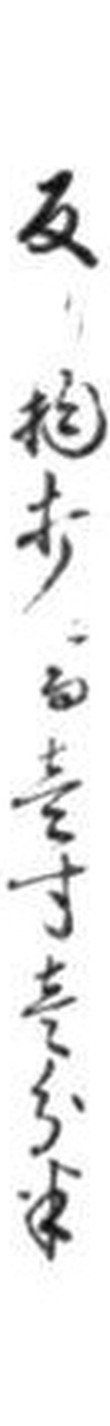反リ物打ニ而壱寸壱分半
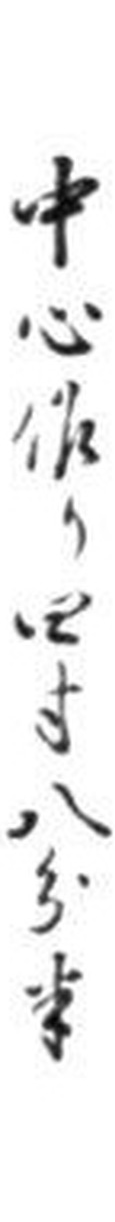中心作リ四寸八分半
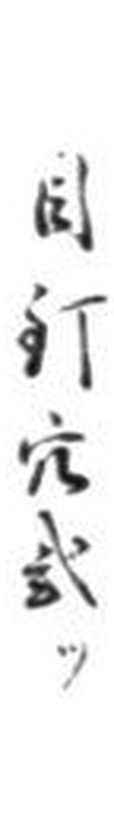目釘穴弐ツ
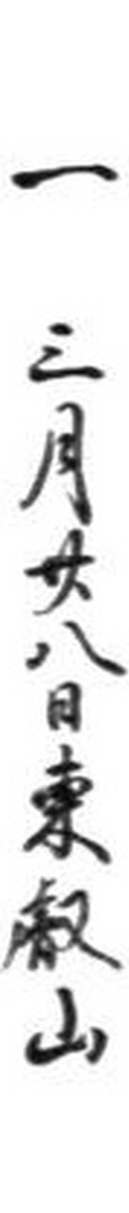一三月廿八日東叡山
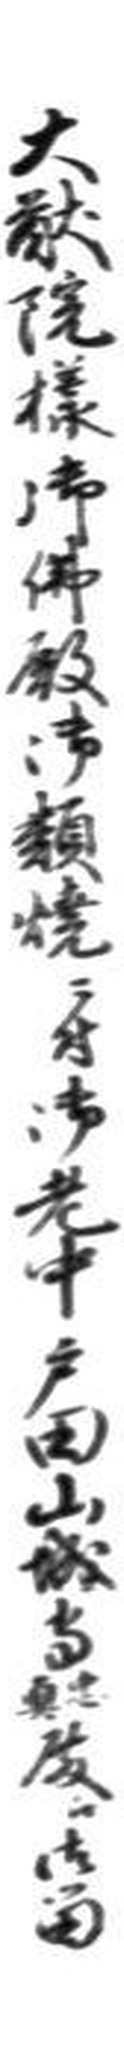大猷院様御仏殿御類焼ニ付御老中戸田山城守忠真殿江御留
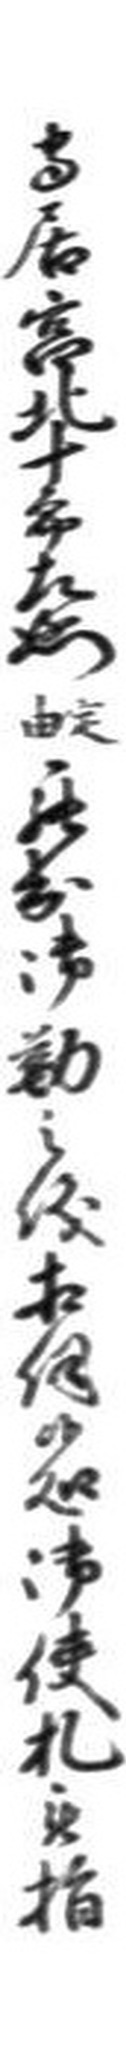守居宮北十郎左衛門定由罷出御勤之儀相伺候処御使札被指
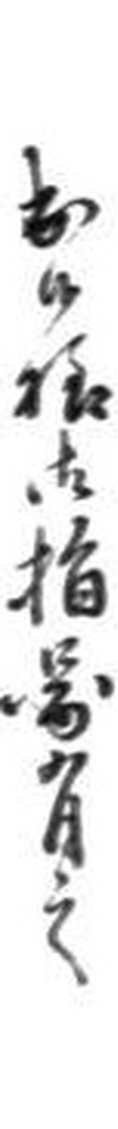出候様御指図有之
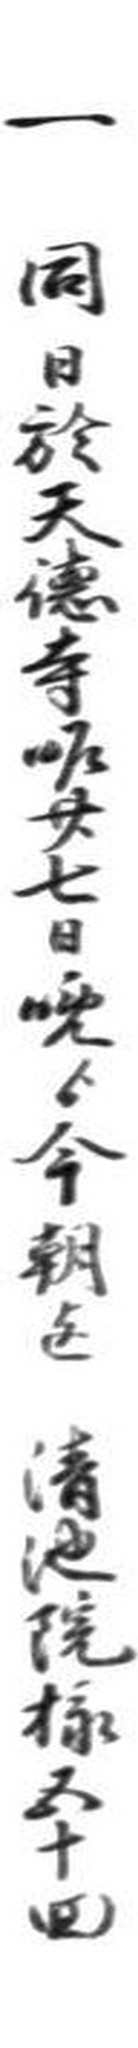一同日於天徳寺昨廿七日晩ゟ今朝迄清池院様五十回
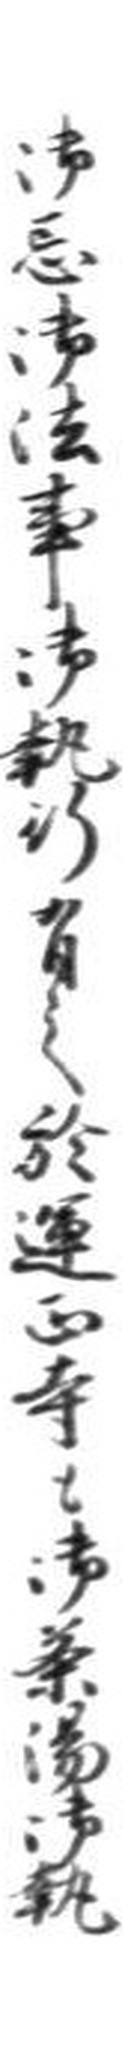御忌御法事御執行有之於運正寺も御茶湯御執
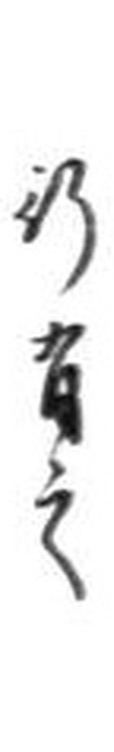行有之
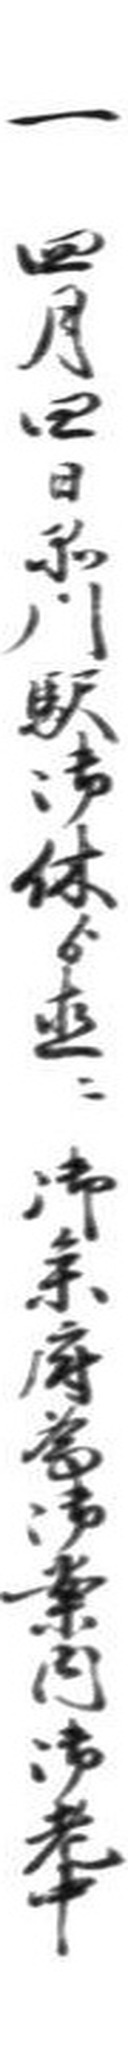一四月四日品川駅御休ゟ直ニ御参府為御案内御老中

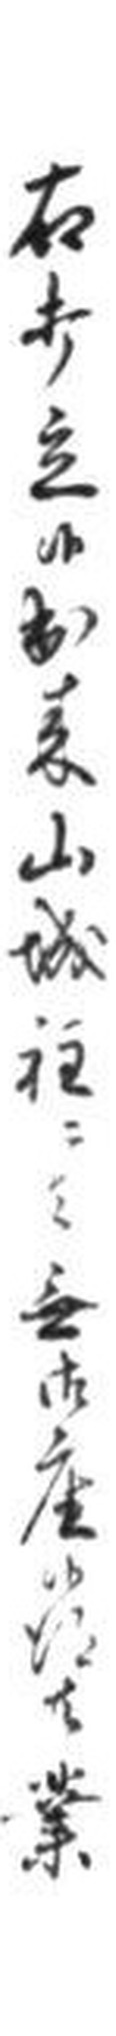右打立候出来山城程ニ者無御座候得共業
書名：家譜 三十四 吉邦公 従享保五年到同六年
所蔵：福井県文書館 Fukui Prefectural Archives
